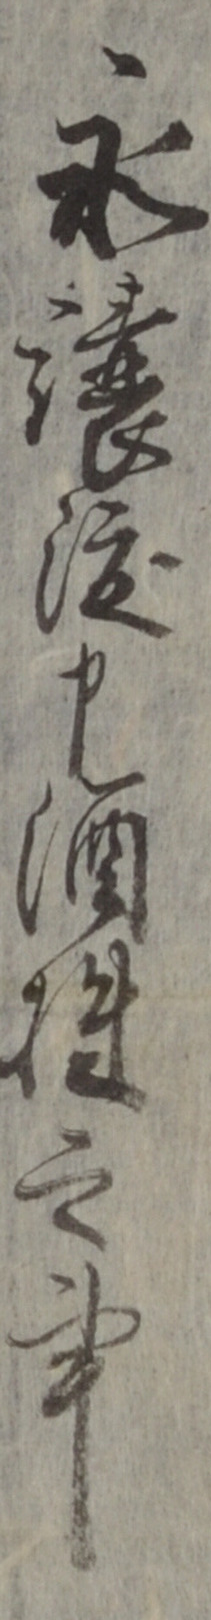永譲渡申酒株之事
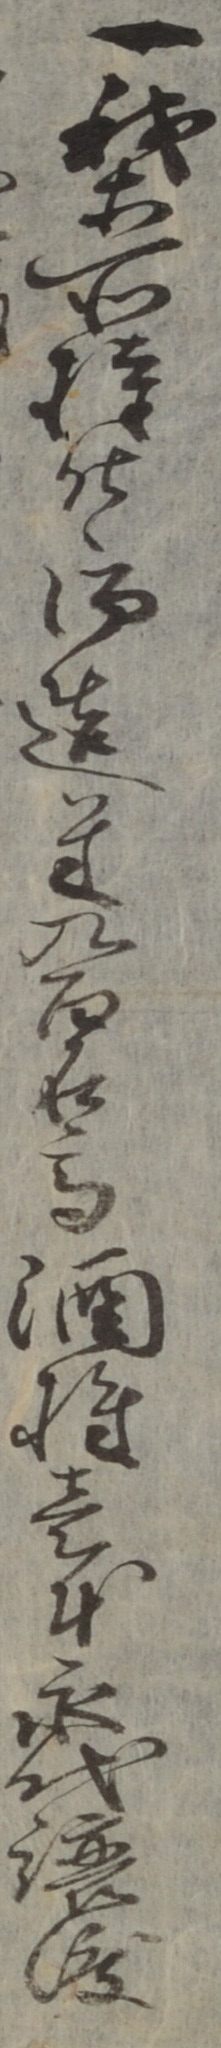一我等所持仕候酒造米九百石高酒株壱本永代譲渡
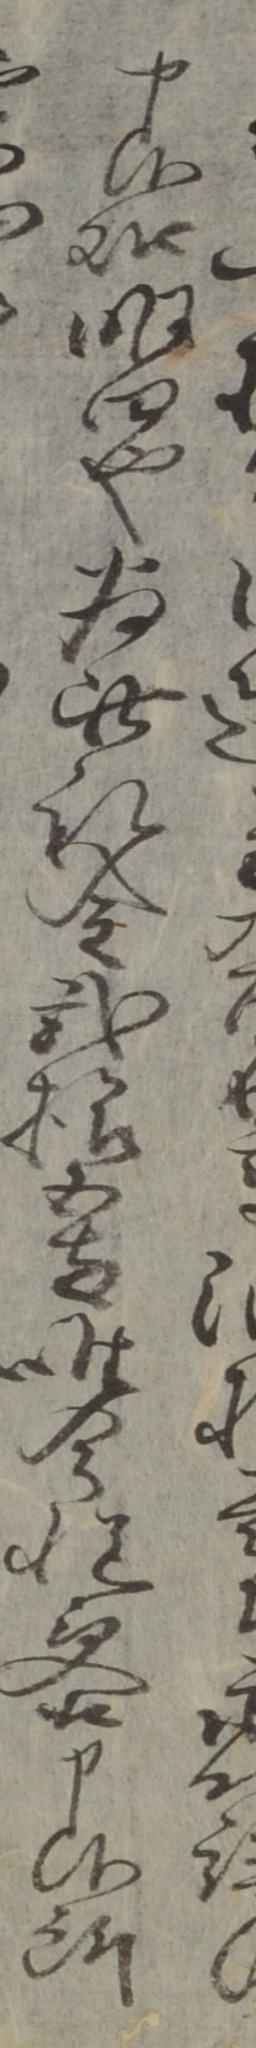申候処明白也為此礼金弐拾五両唯今慥受取申候所
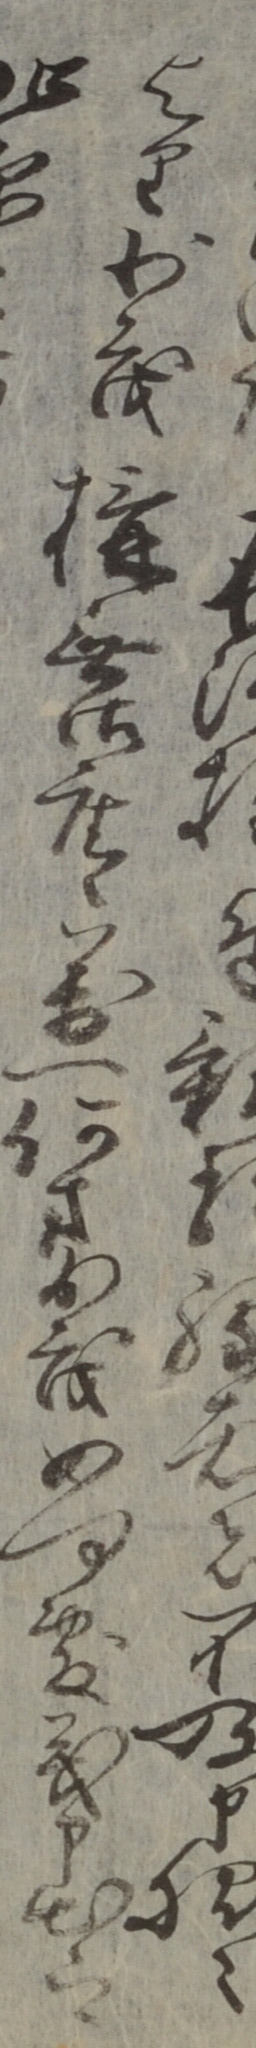より少茂構無御座候万一何方ゟ茂如何敷義申出候ハゝ
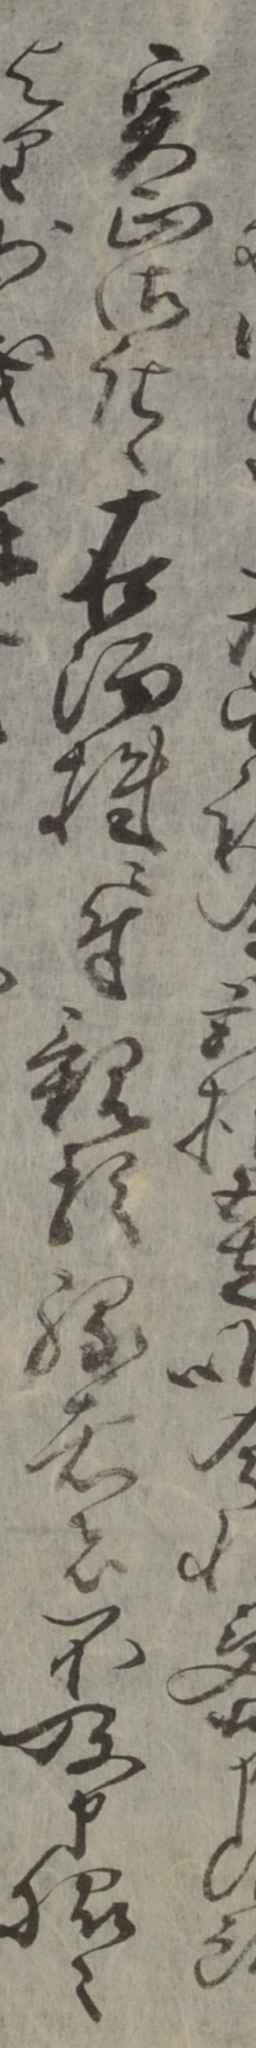実正御座候右酒株ニ付親類縁者者不及申脇々
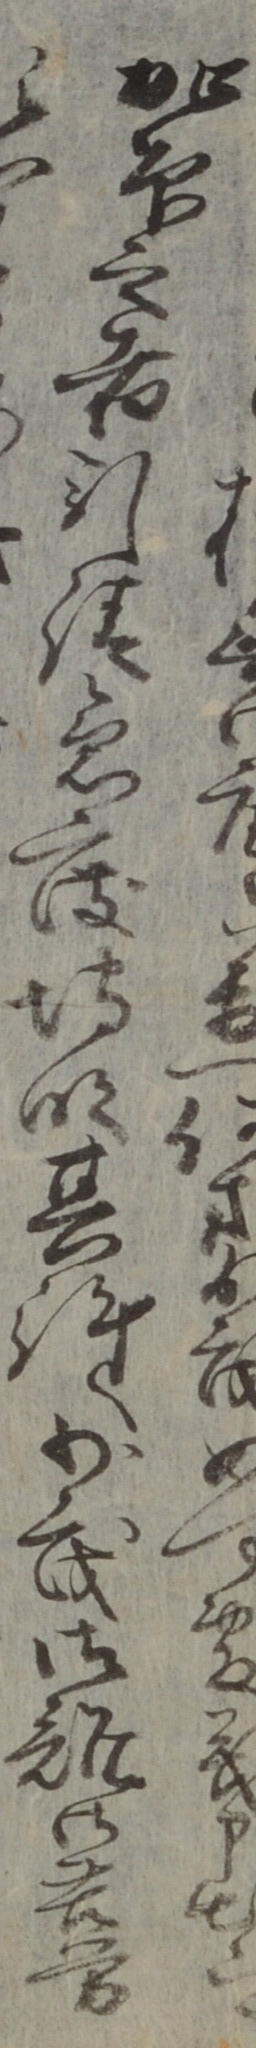加印之者引請急度埒明其許へ少茂御難御苦労
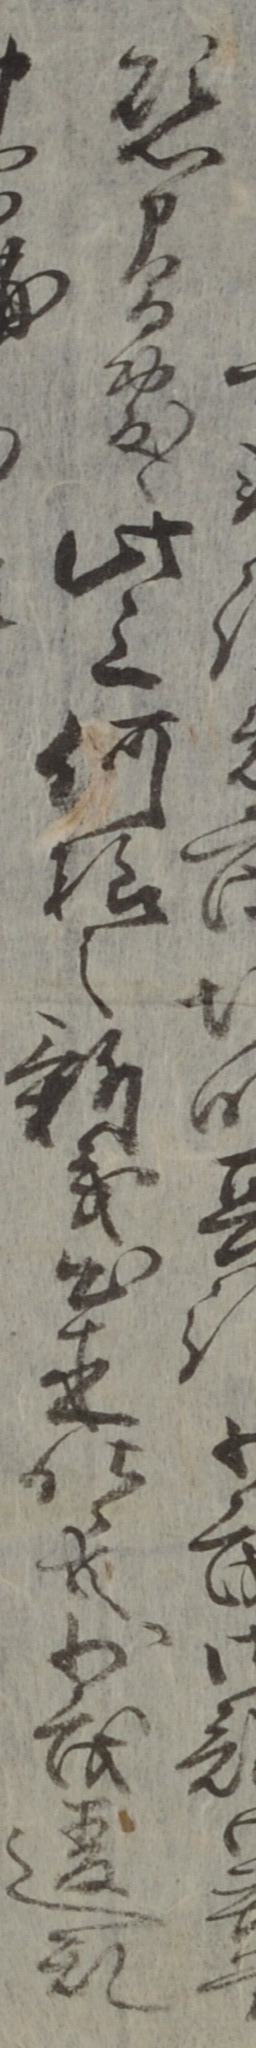懸申間敷候此上何様之難義出来仕候共少茂違乱
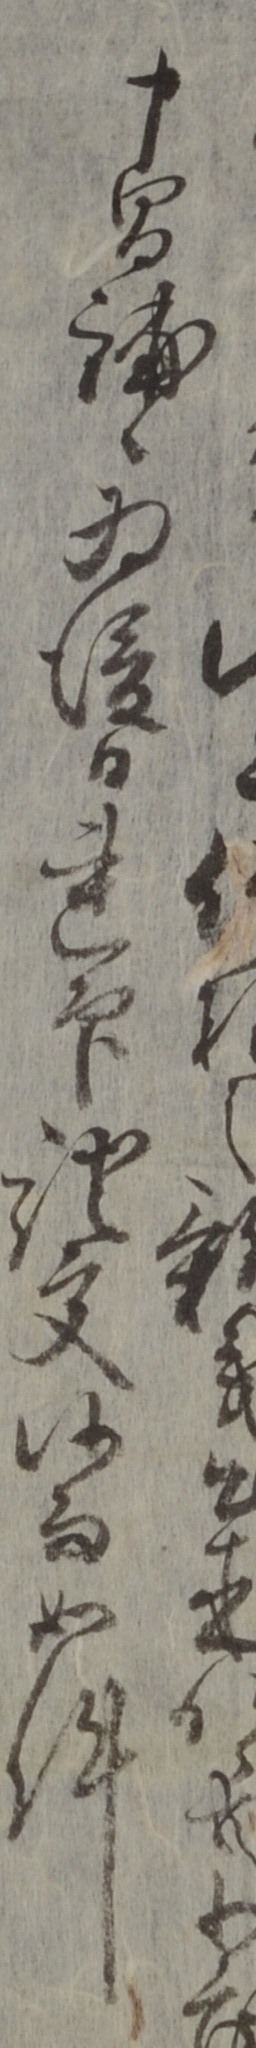申間鋪候為後日連印証文仍而如件
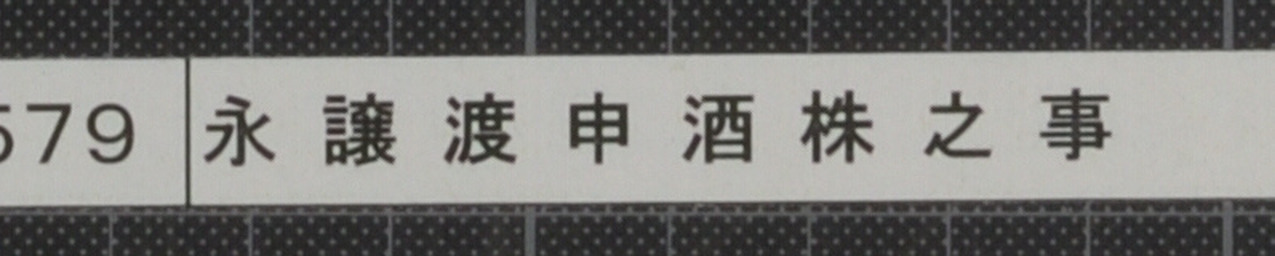永譲渡申酒株之事
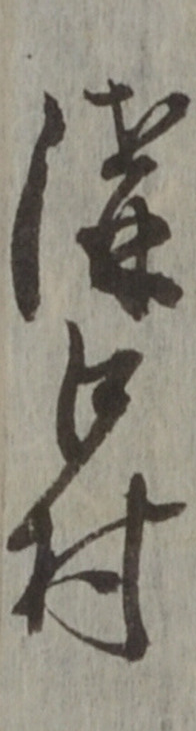溝口村
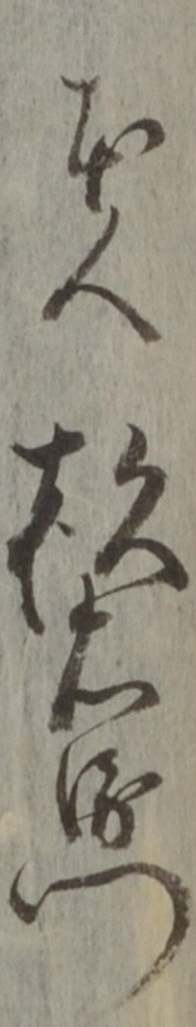本人杉右衛門
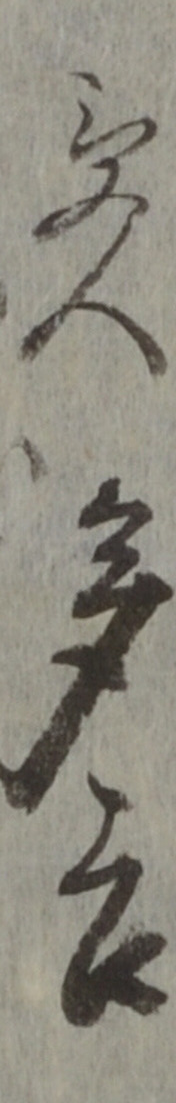受人多吉
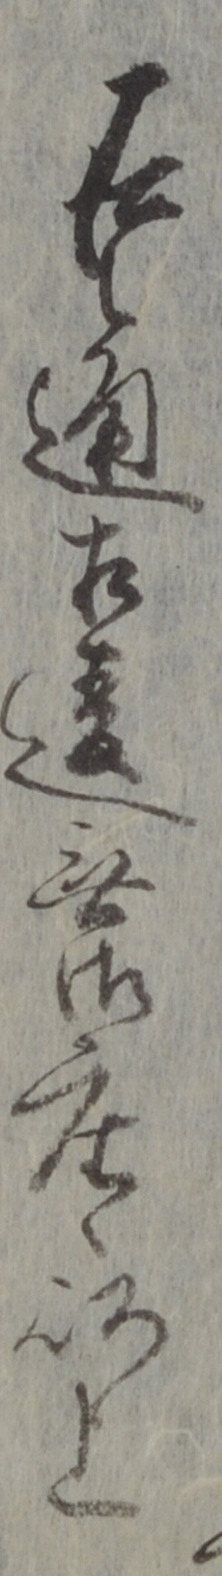右之通相違無御座候以上
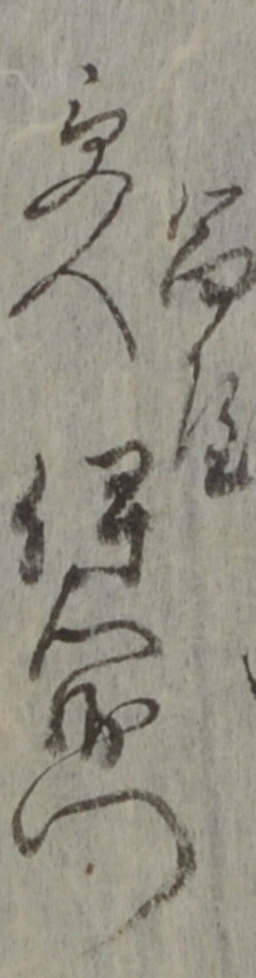受人伊右衛門
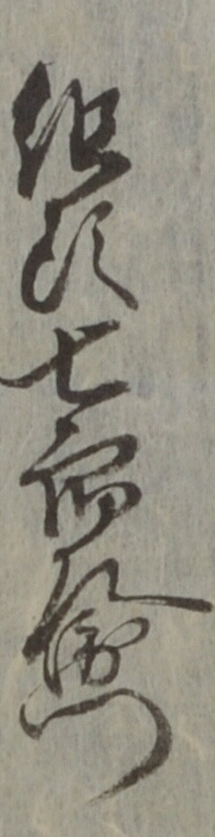組頭七郎左衛門
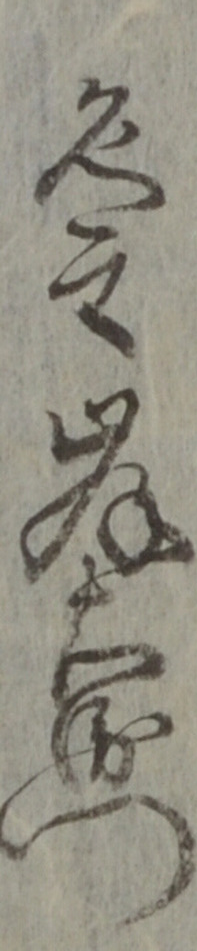名主岸右衛門
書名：永譲渡申酒株之事
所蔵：伊那市立高遠町図書館・合同会社AMANE
